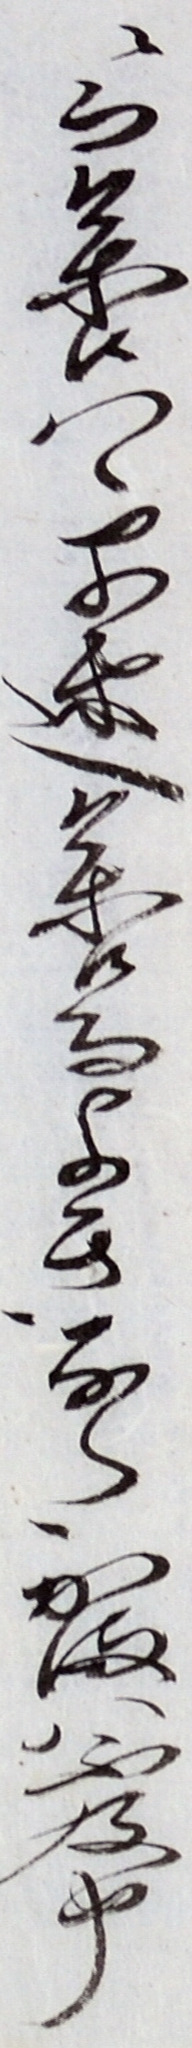ニ而参候ハヽ早速参候而よきなたかまハ不及申
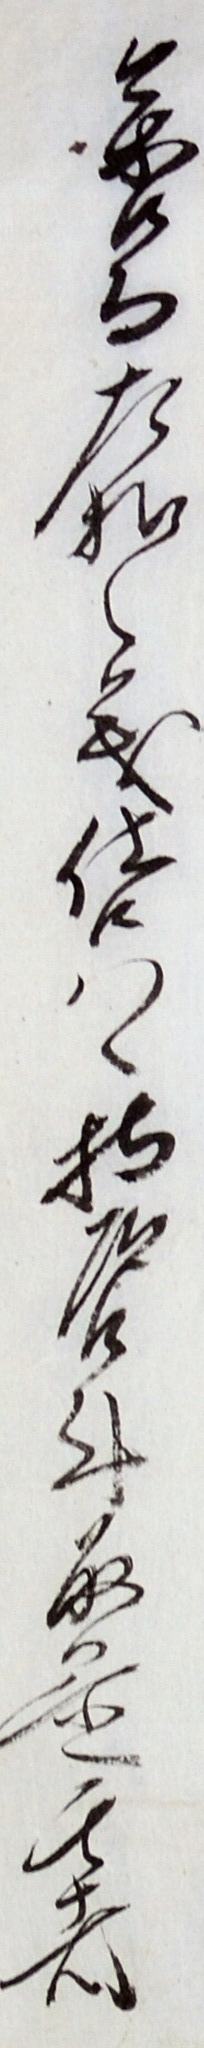参候而左様之義仕候ハヽ持道具計取置其者
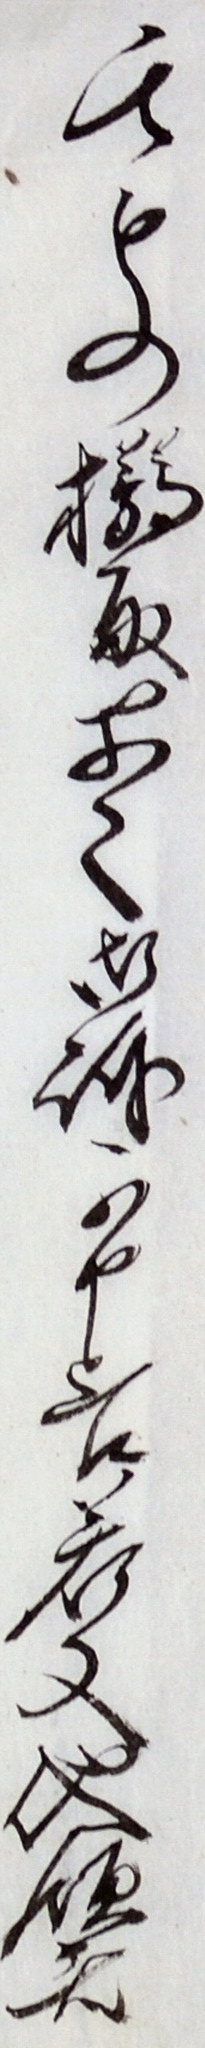其もの搦取早々御訴可申上候若又他領者

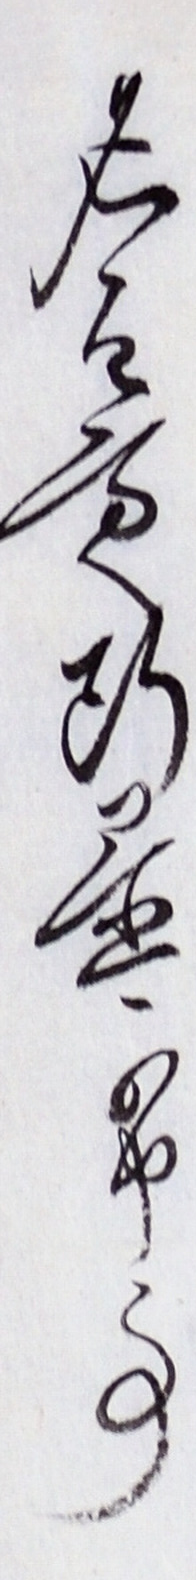名主方へ断置可申事
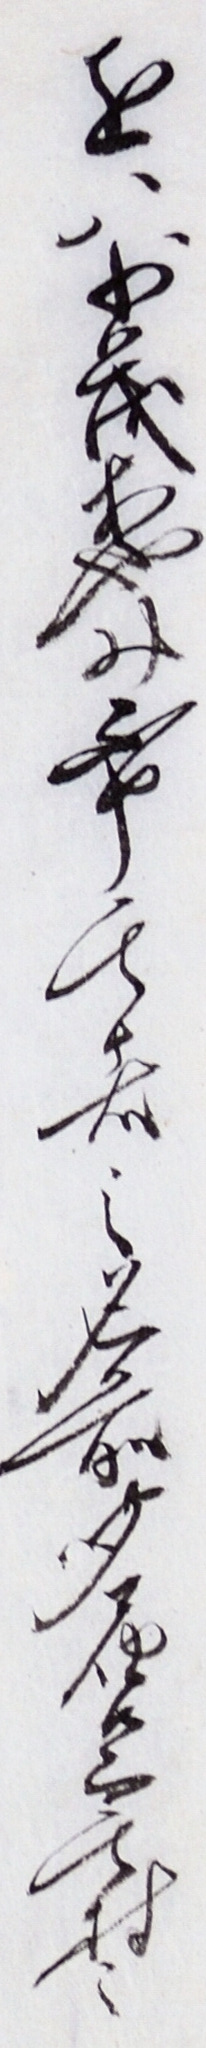をハ少もあやみ不申其者之名前聞届候而其村之
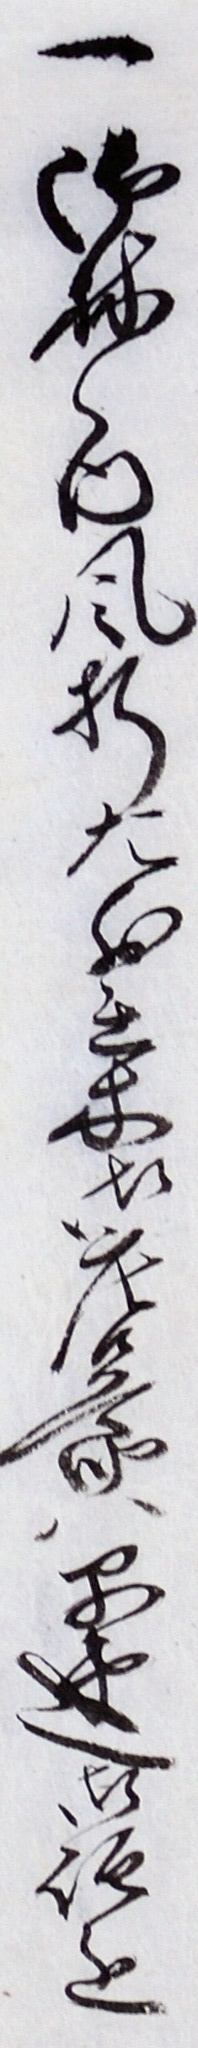一御林之内風折たおれ木御座候節ハ早速御注進
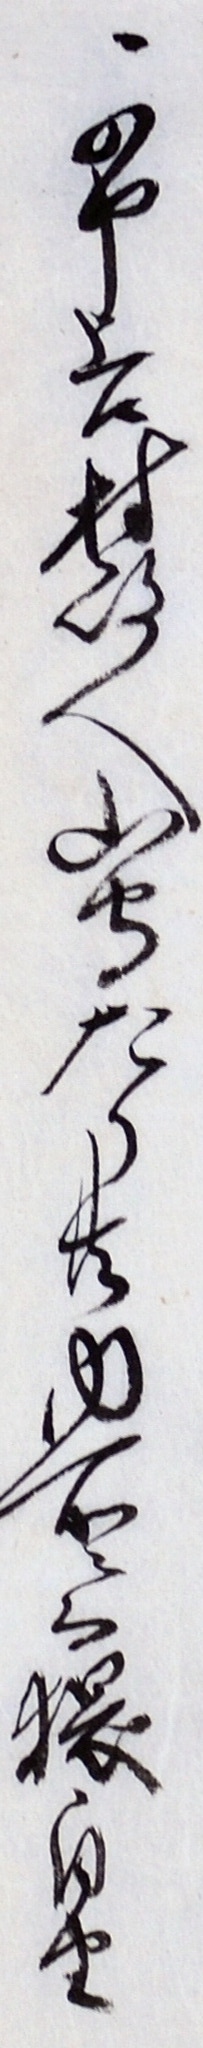可申上候村役人山守たり共内所ニ而猥自由
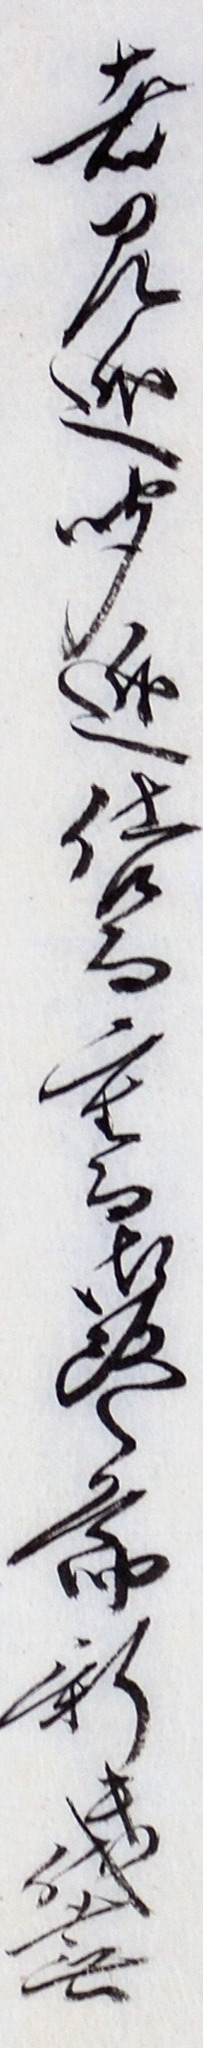者見逃聞逃仕候而重而御改候節新キ伐蕪
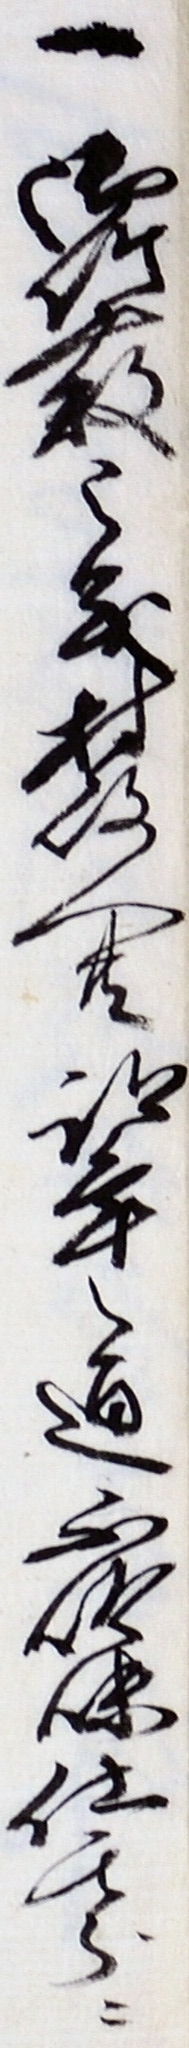一御竹薮之義村役人共跡年之道不吟味仕其分ニ
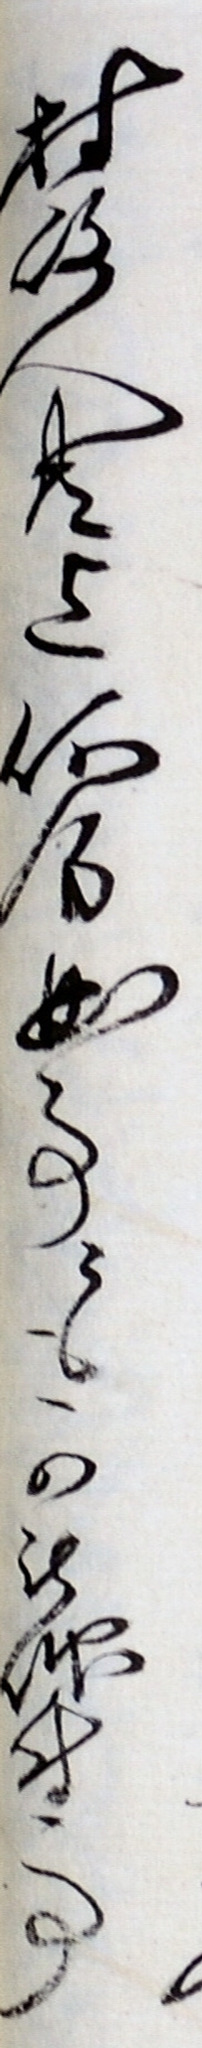村役人共迄何分曲事ニも可被仰付事
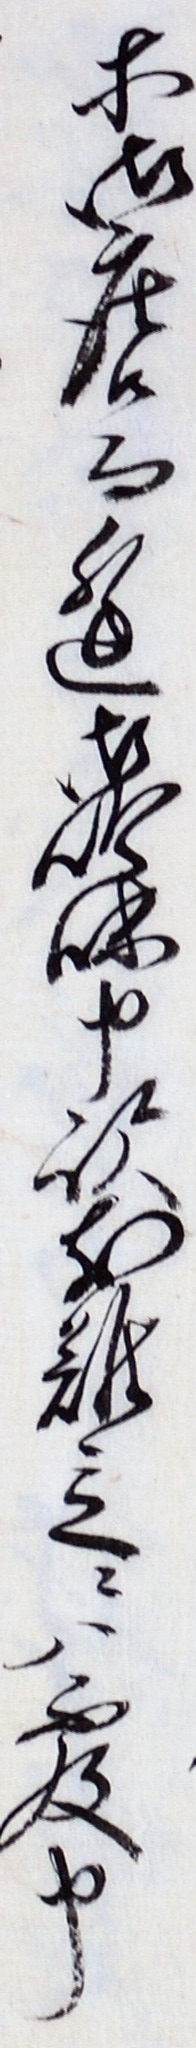等御座候而逢御吟味申訳義難立ニハ不及申
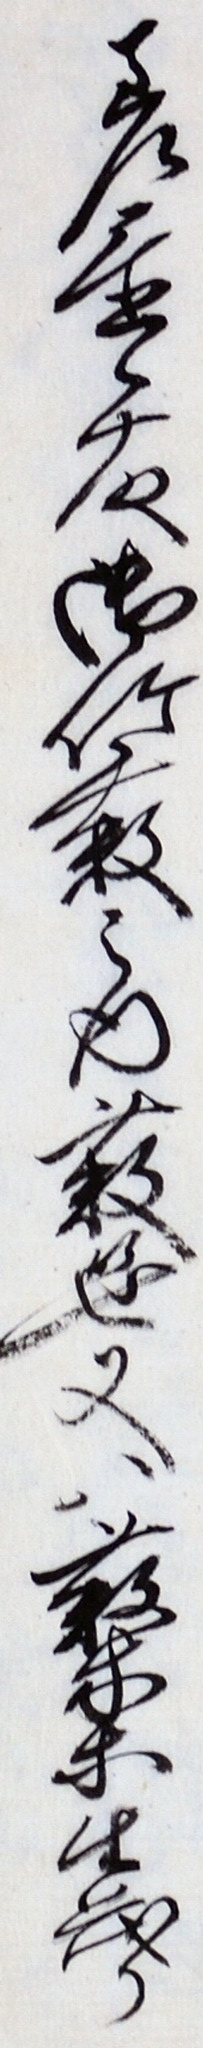差置候故御竹薮之内薮笹又ハ薮木等生茂り
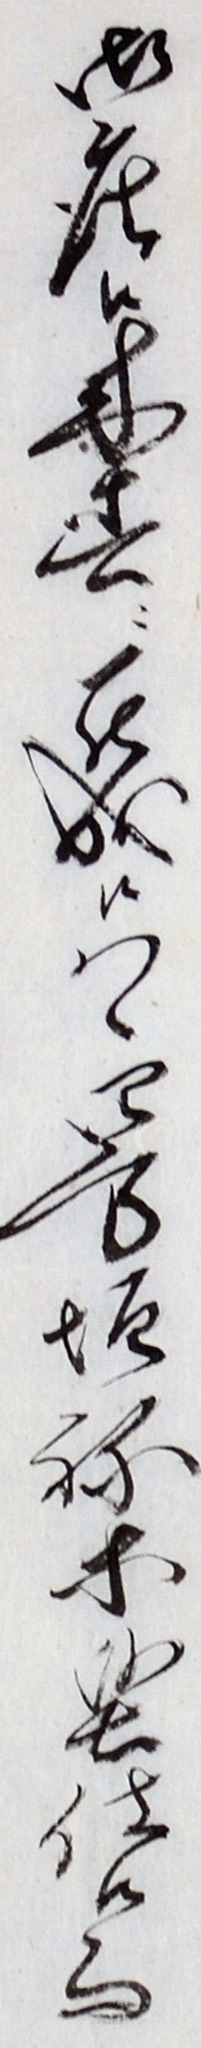御座候来春ニ罷成候ハヽ四方垣ね等堅仕候而
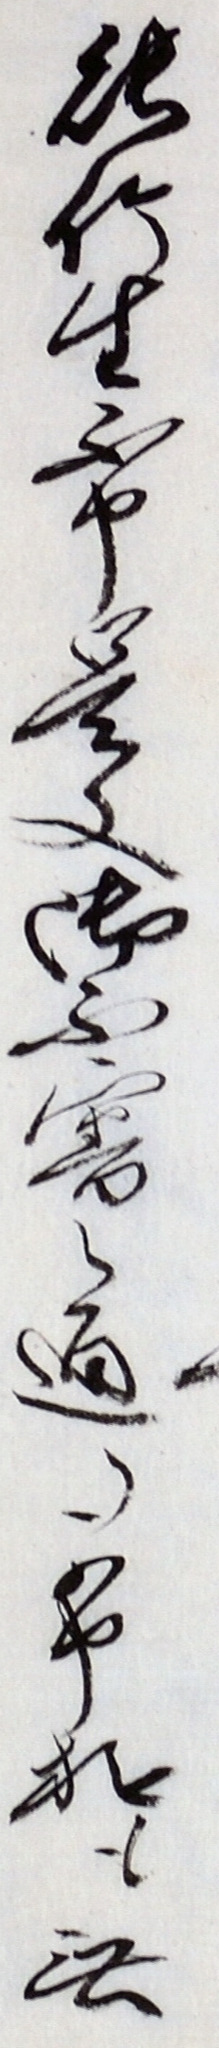能竹生不申是又御不審之通り可申様も無
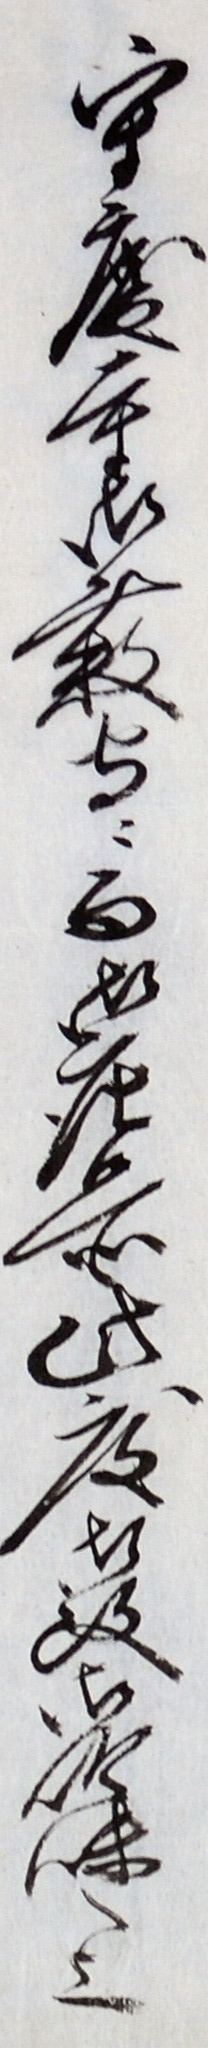守慶寺御薮守ニ而御座候所此度御役御吟味之上
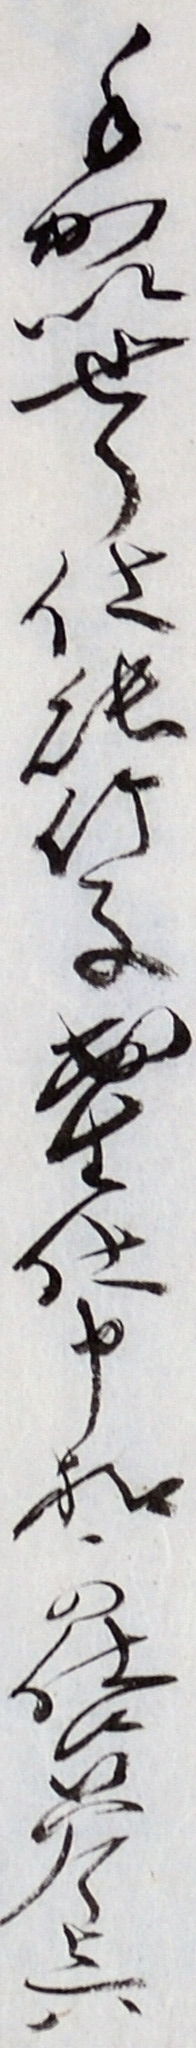手かいせう仕能竹子出生仕申様可仕候只今迄ハ
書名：御林御竹藪証文控
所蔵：伊那市立高遠町図書館・合同会社AMANE
